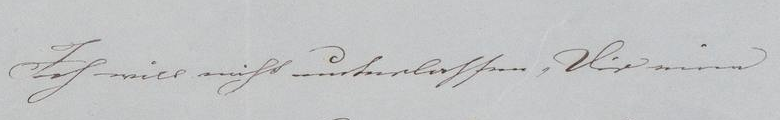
Ich will nicht unterlassen, Dir eine
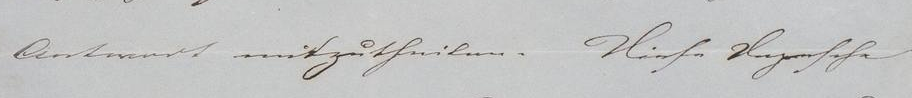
Antwort mitzutheilen. Diese Depesche
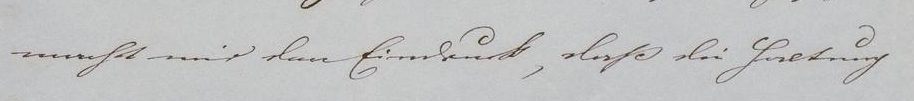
macht mir den Eindruck, daß die Haltung
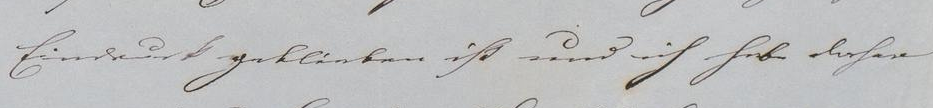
Eindruck geblieben ist und ich habe daher
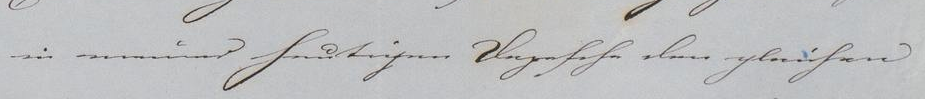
in meiner heutigen Depesche den gleichen
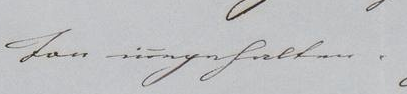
Ton innegehalten.
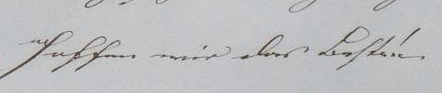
Hoffen wir das Beste.
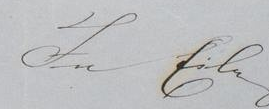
In Eile
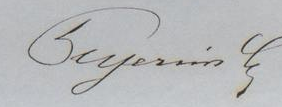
Peyer im Hof
